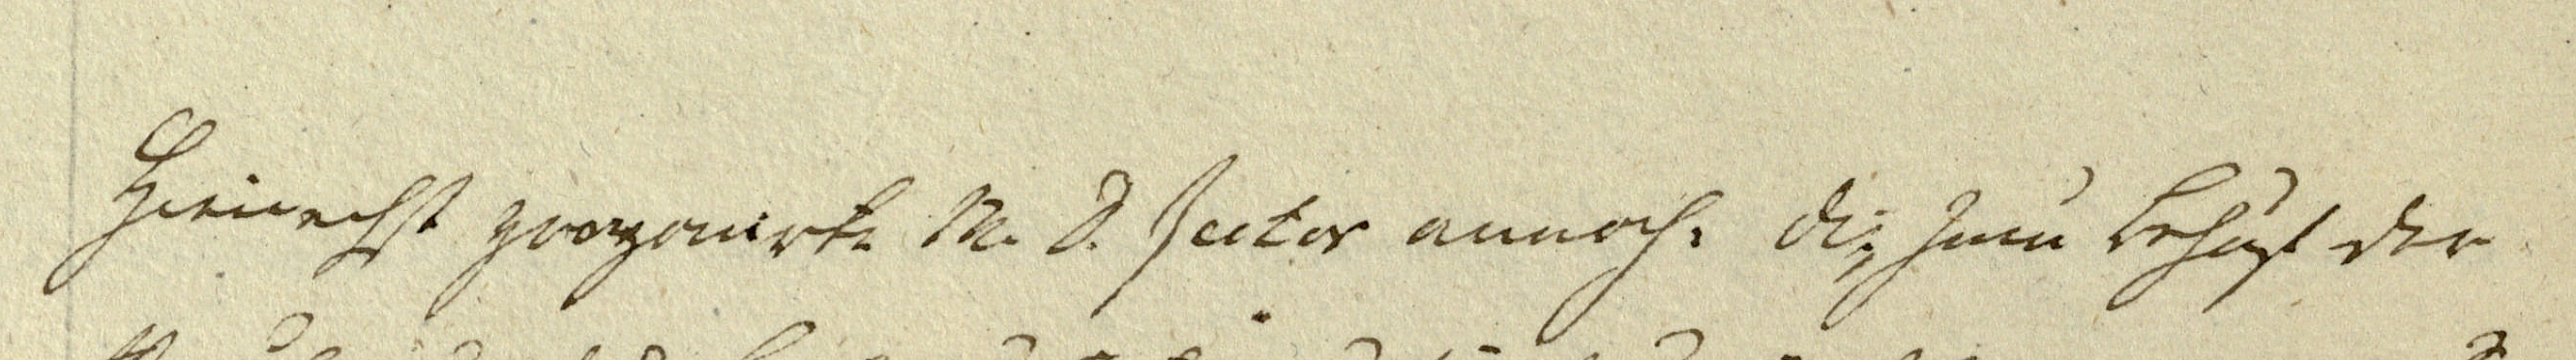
Hienechst proponirte M. D. Rector annoch: die zum Behuf der
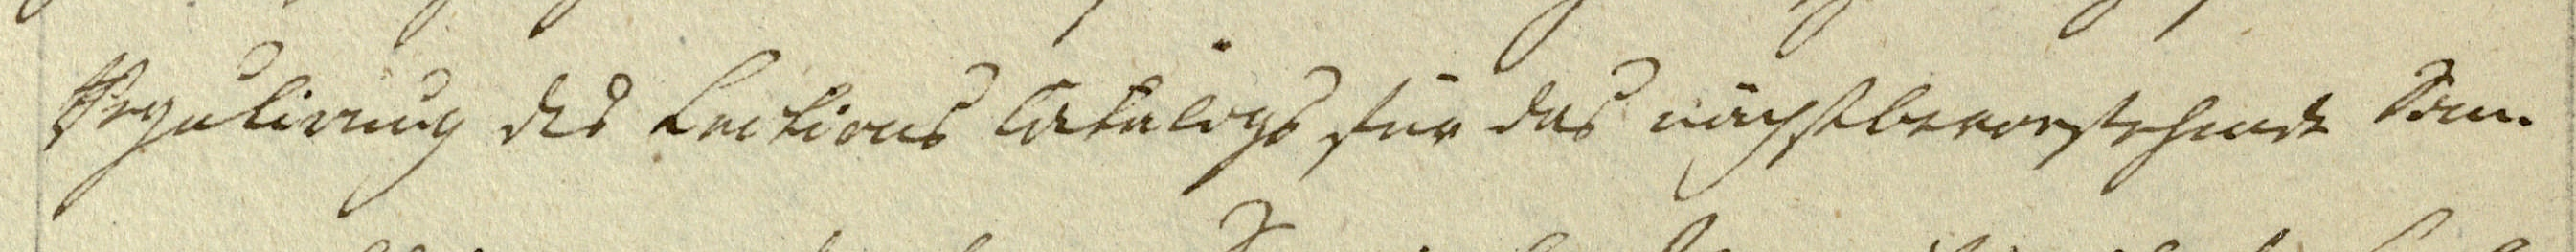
Regulirung des Lections Catalogs für das nächstbevorstehende Som¬
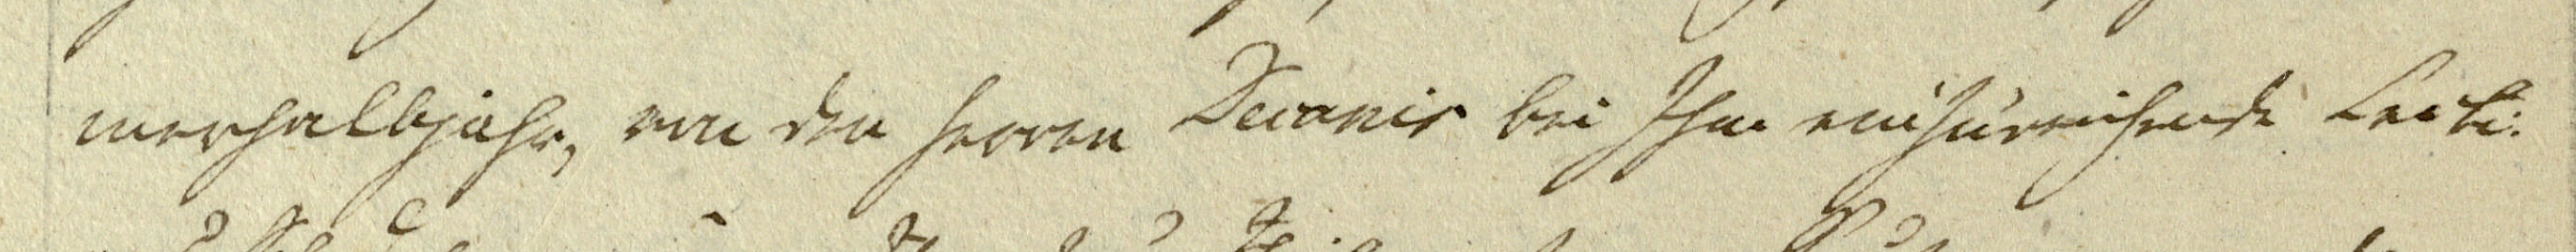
merhalbjahr, von den Herren Decanis bei Ihm einzureichende Lecti¬
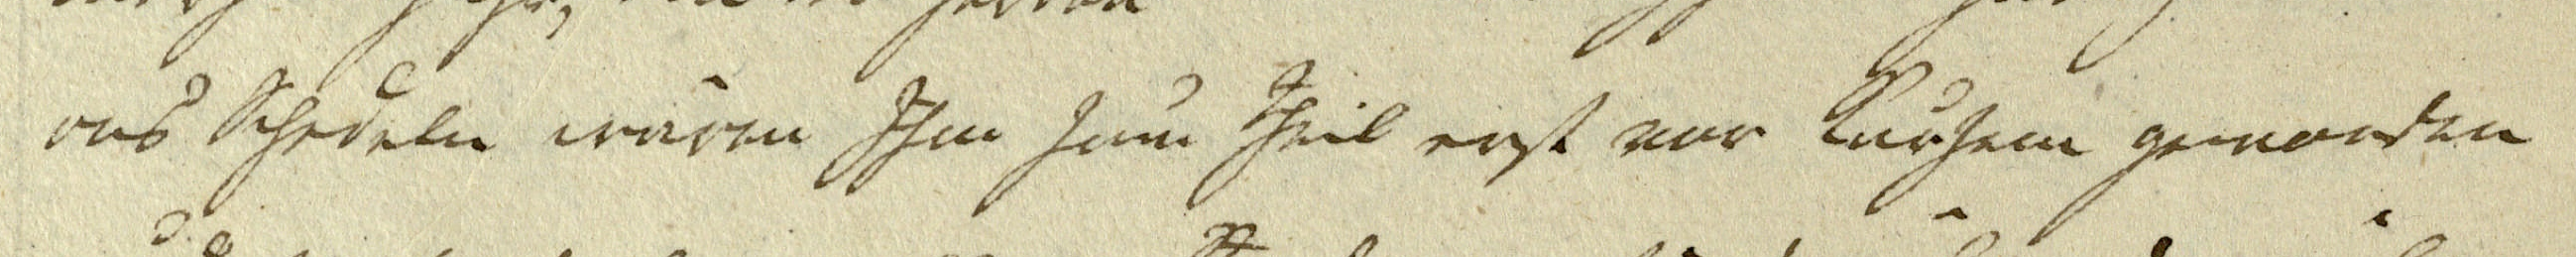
ons Schedeln wären Ihm zum Theil erst vor Kurzem geworden
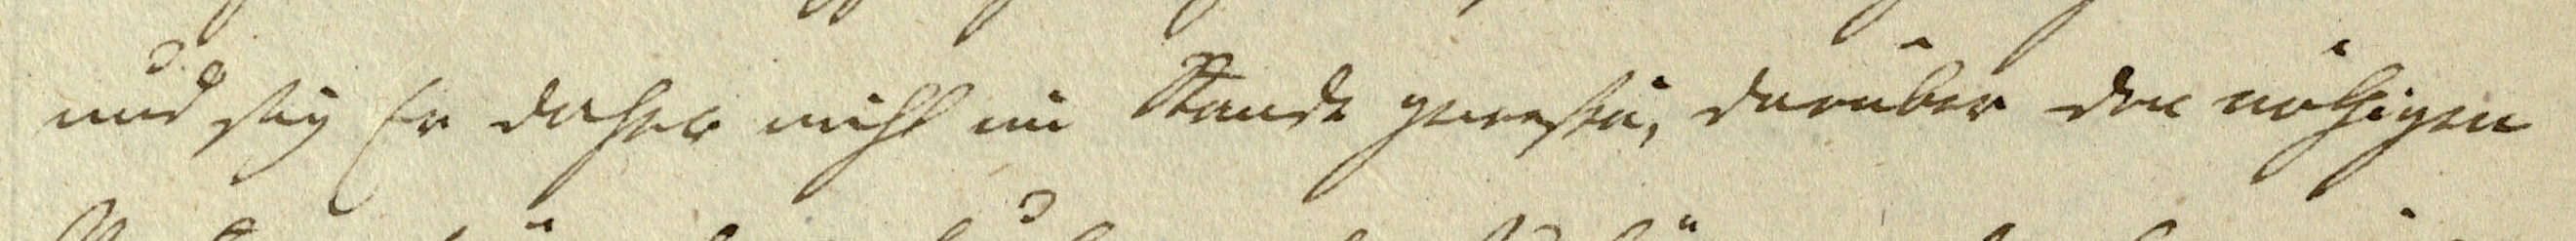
und seÿ Er daher nicht im Stande gewesen, darüber den nöthigen
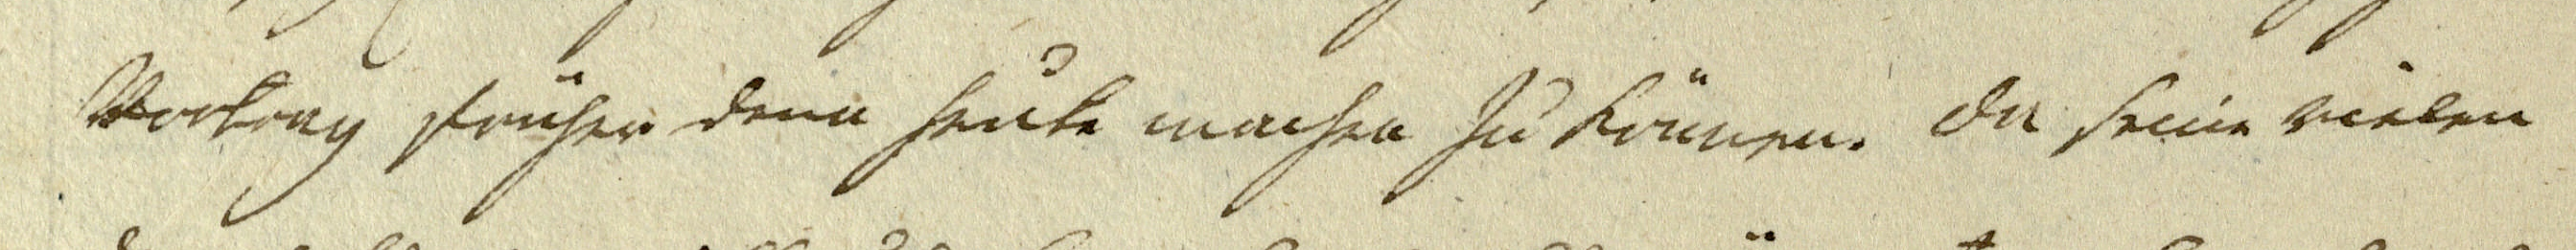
Vortrag früher denn heute machen zu können. Da seine vielen
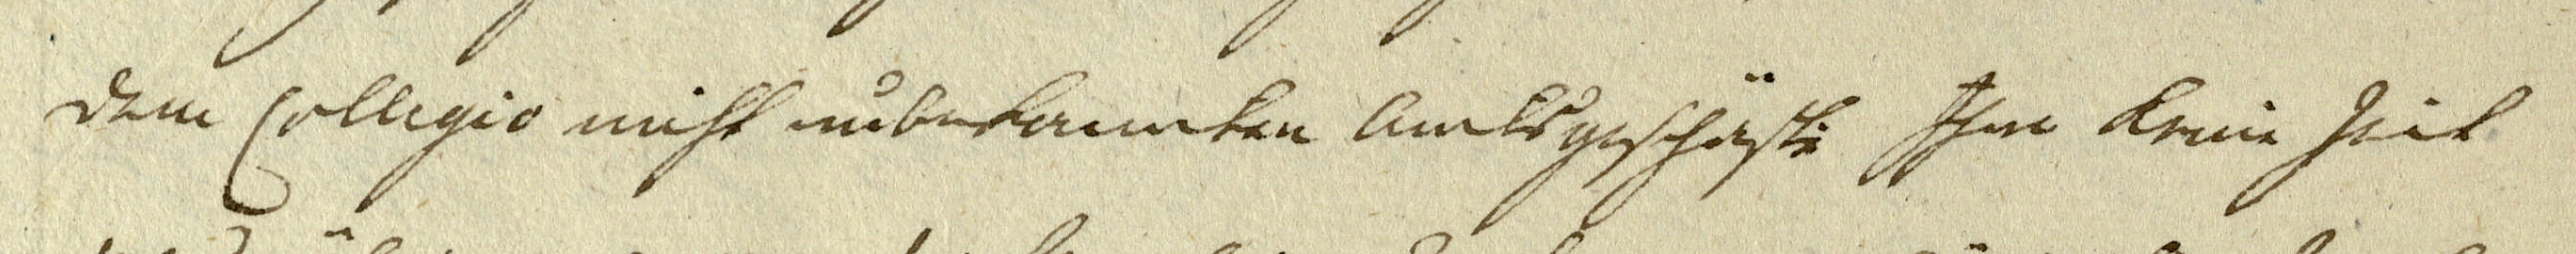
dem Collegio nicht unbekannten Amtsgeschäfte Ihm keine Zeit
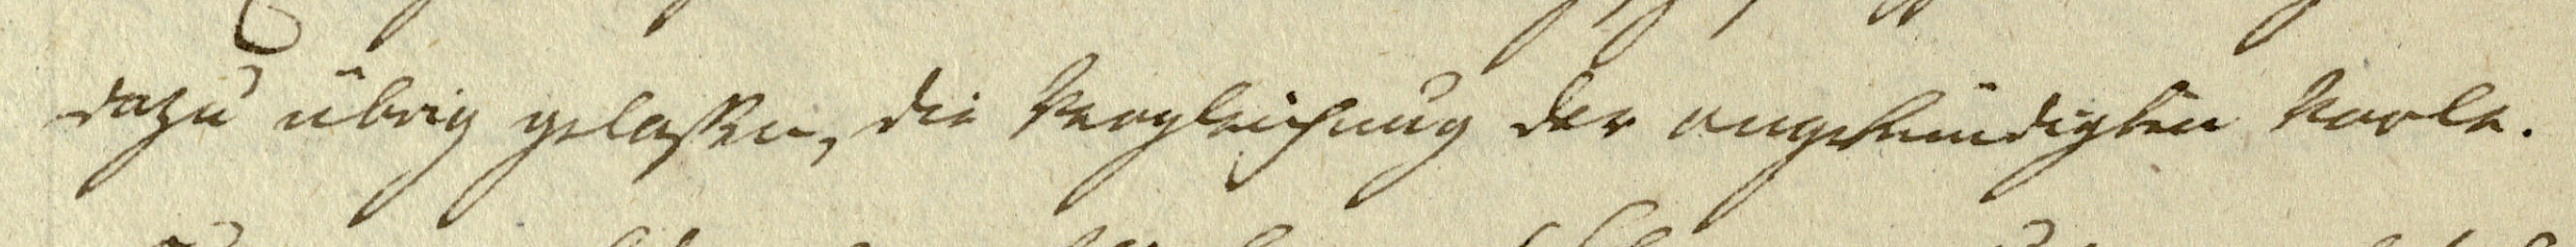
dazu übrig gelassen, die Vergleichung der angekündigten Vorle¬
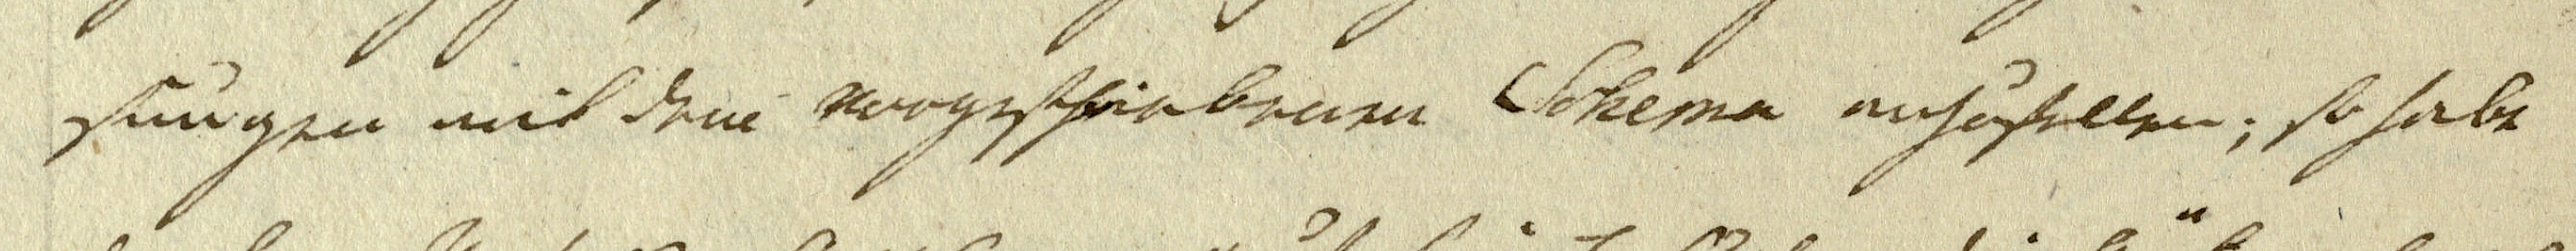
sungen mit dem vorgeschriebenen Schema anzustellen; so habe
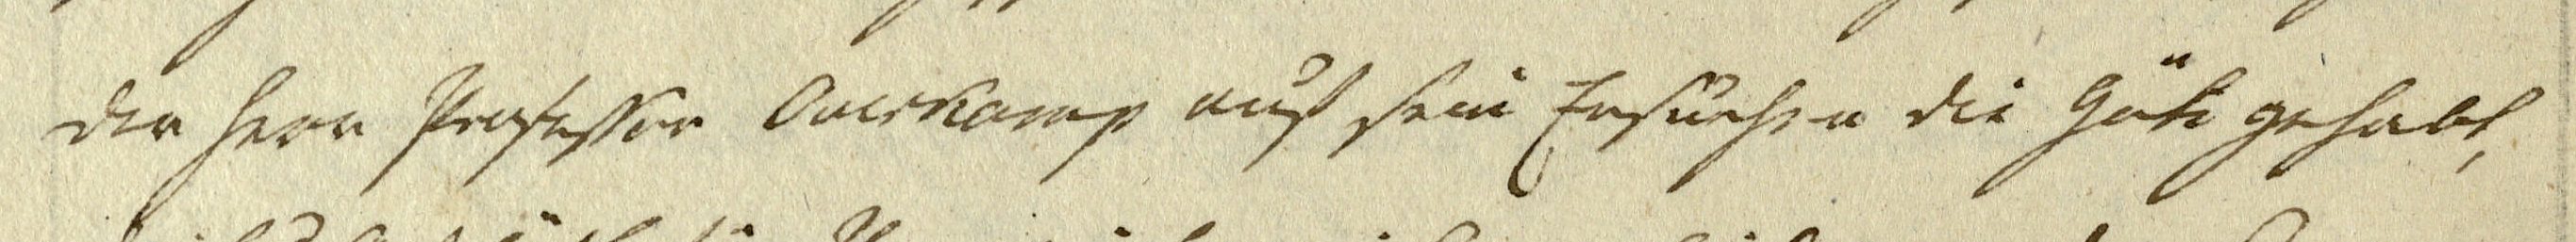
der Herr Professor Overkamp auf sein Ersuchen die Güte gehabt,
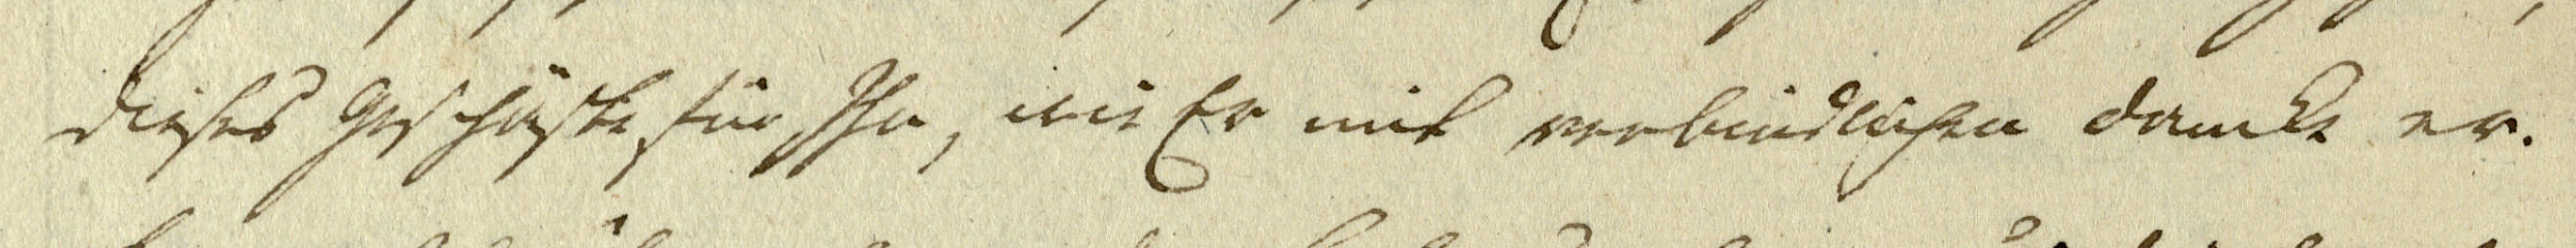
dieses Geschäfte für Ihn, wie Er mit verbindlichen dancke er¬
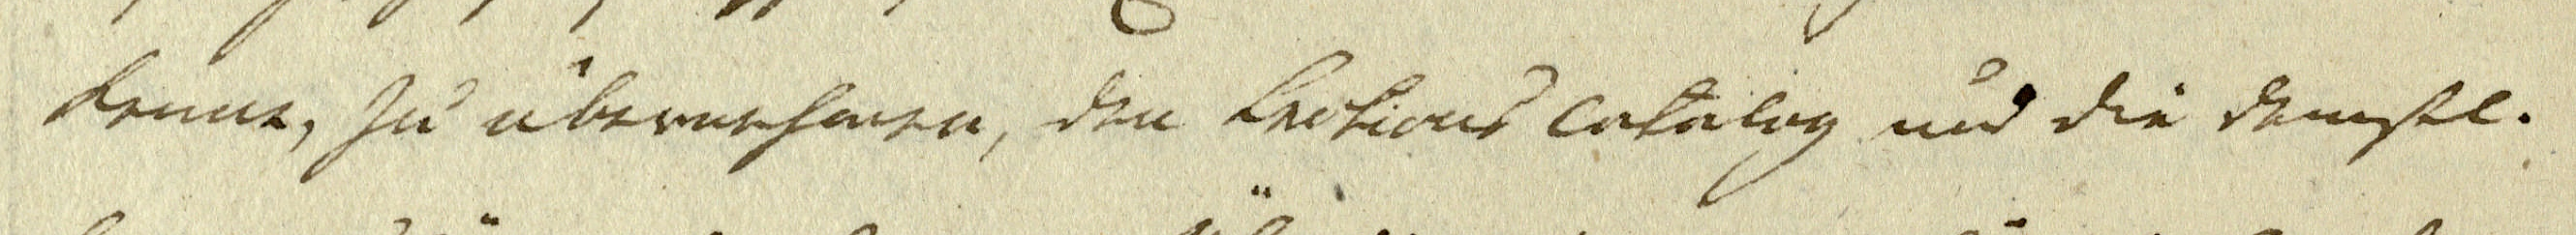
kenne, zu übernehmen, den Lections Catalog und die demsel¬
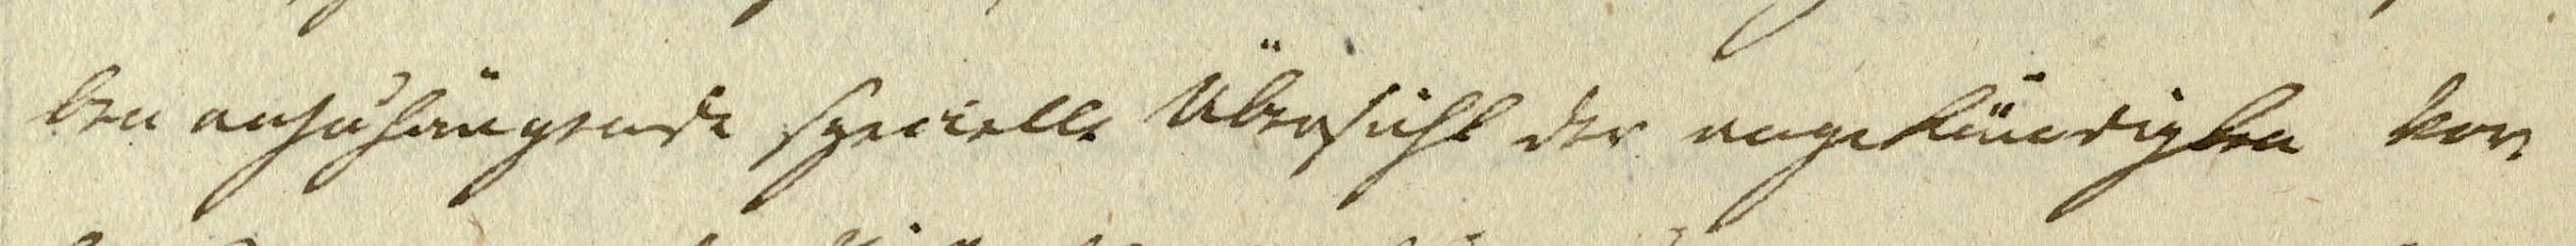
ben anhängende specielle Übersicht der angekündigten Vor¬
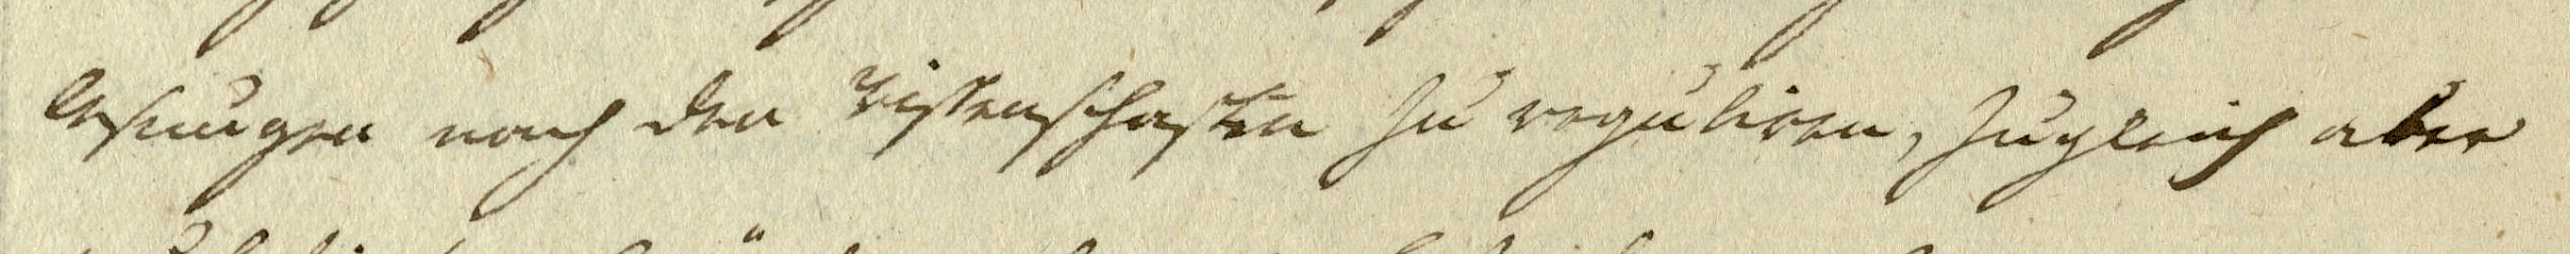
lesungen nach den Wissenschaften zu reguliren, zugleich aber
